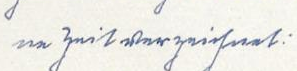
ne Zeit verzeichnet:
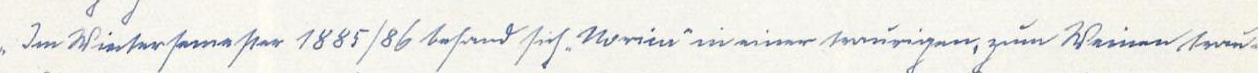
Im Wintersemester 1885/86 befand sich Norica, in einer traurigen, zum Weinen trau-
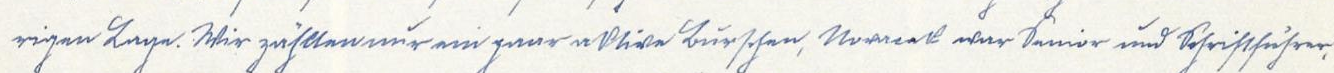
rigen Lage. Wir zählten nur ein paar aktive Burschen, Novacek war Senior und Schriftführer,
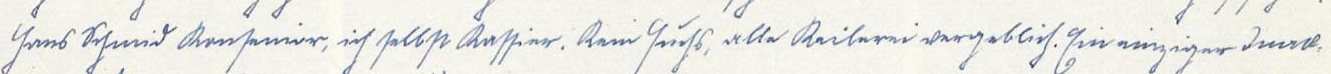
Hans Schmid Konsenior, ich selbst Kassier. Kein Fuchs, alle Reibereien vergeblich. Ein einziger Inak-
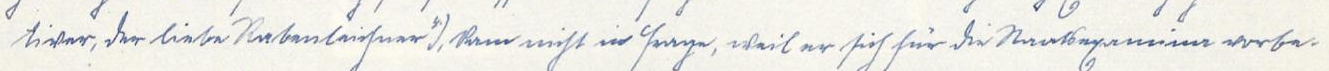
tiver, der liebe Rabenleichner 4). kam nicht in Frage, weil es sich für die Staatsexamina vorbe-
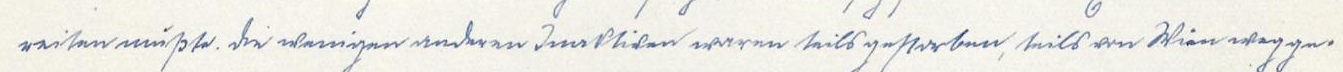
reiten musste. Die wenigen anderen Inaktiven waren teils gestorben, teils von Wien wegge-
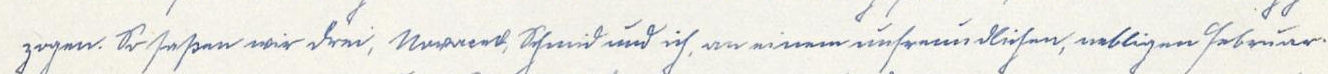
zogen, so saßen wir drei, Novacek, Schmid und ich, an einem unfreundlichen, nebligen Februar-
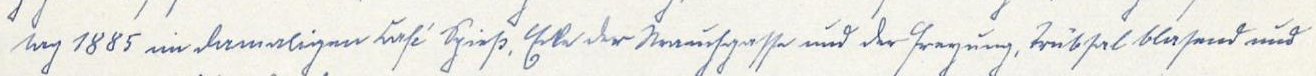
tag 1885 im damaligen Café Spieß, Ecke der Strauchgasse und der Freyung, Trübsal blasend und
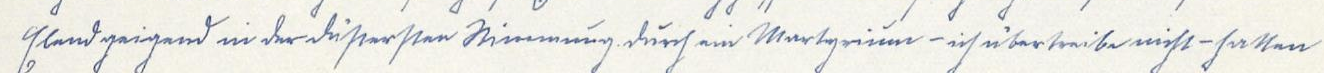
Elend geigend in der düstersten Stimmung durch ein Martyrium - ich übertreibe nicht – hatten
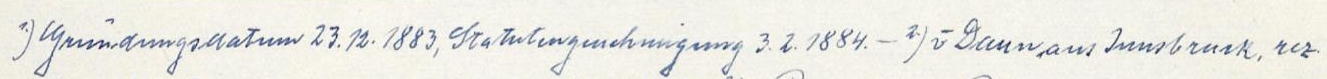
1) Gründungsdatum 23.12.1883, Statutengenehmigung 3.2. 1884.- 2) v/o Daun aus Innsbruck, rez.
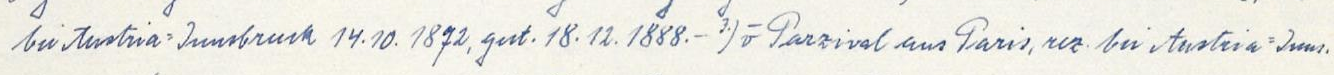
bei Austria Innsbruck 14.10.1872, gest. 18. 12. 1888.- 3) v/o Parzival aus Paris, rez. bei Austria Inns-
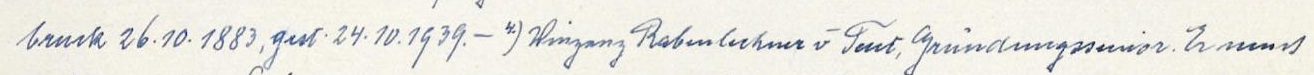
bruck 26.10.1883, gestorben 24.10.1939.- Vinzenz Rabenlechner v/o Tent, Gründungssenior. Er muss
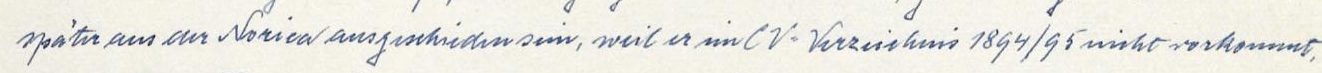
später aus der Norica ausgeschieden sein, weil er im CV-Verzeichnis 1894/95 nicht vorkommt,
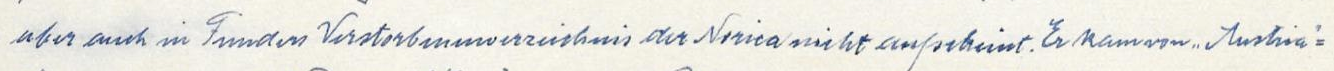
aber auch im Fundus Verstorbenenverzeichnis der Norica nicht aufscheint. Er kam von Austria –
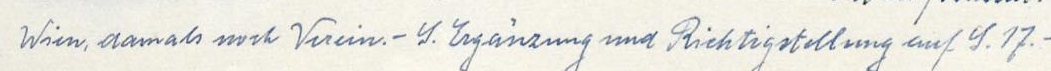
Wien, damals noch Verein – S. siehe Ergänzung und Richtigstellung auf S. 17.-
